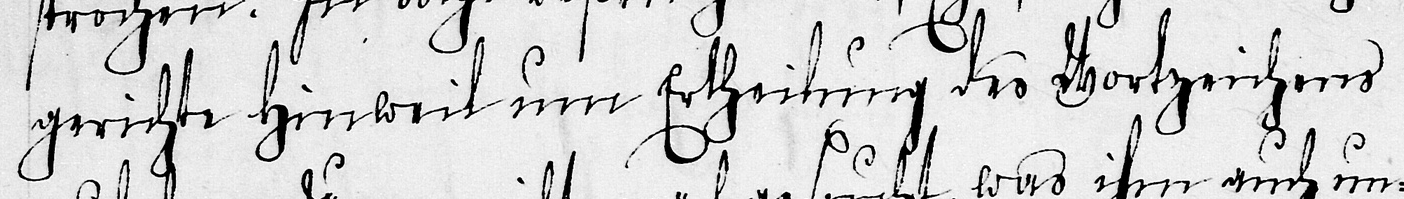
gerichte Hinweil um Ertheilung des Wortzeichens
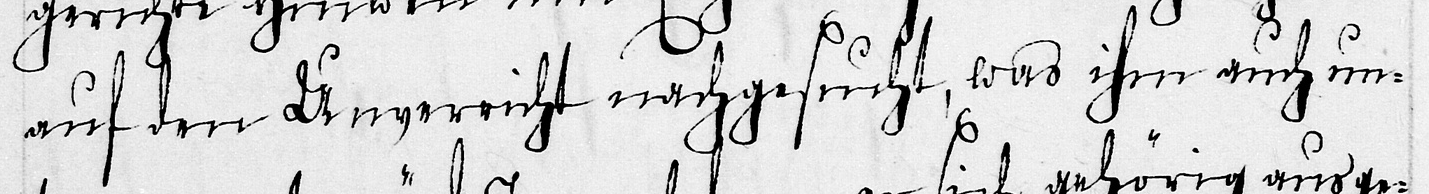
auf den Unverricht nachgesucht, was ihm auch un¬
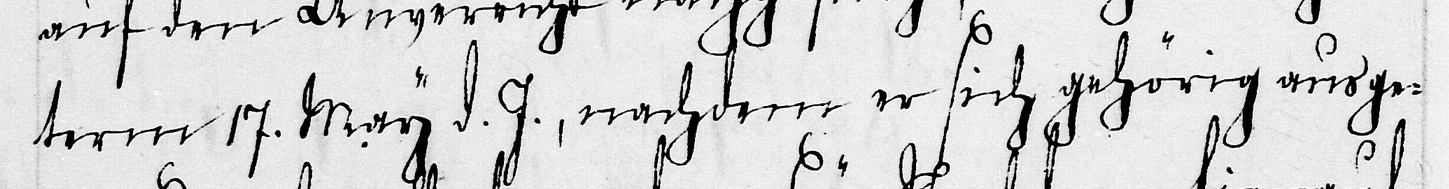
term 17. May d. J., nachdem er sich gehörig ausge¬
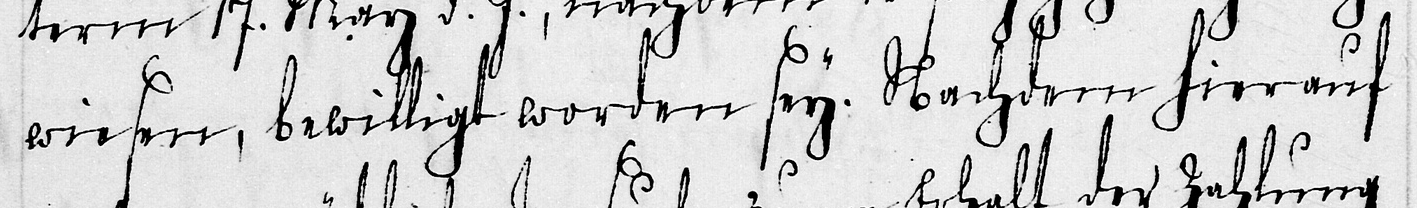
wiesen, bewilligt worden sey. Nachdem hierauf
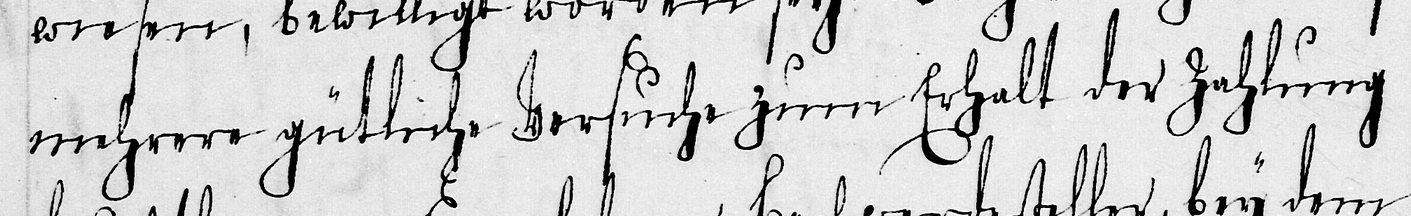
mehrere gütliche Versuche zum Erhalt der Zahlung
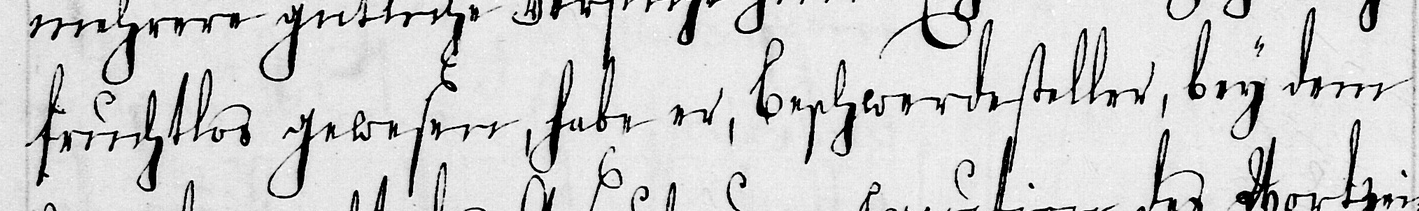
fruchtlos gewesen, habe er, Beschwerdesteller, bey dem
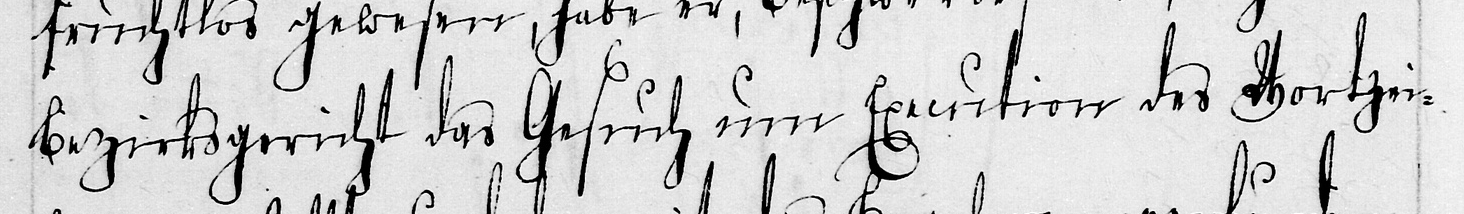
Bezirksgericht das Gesuch um Execution des Wortzei¬
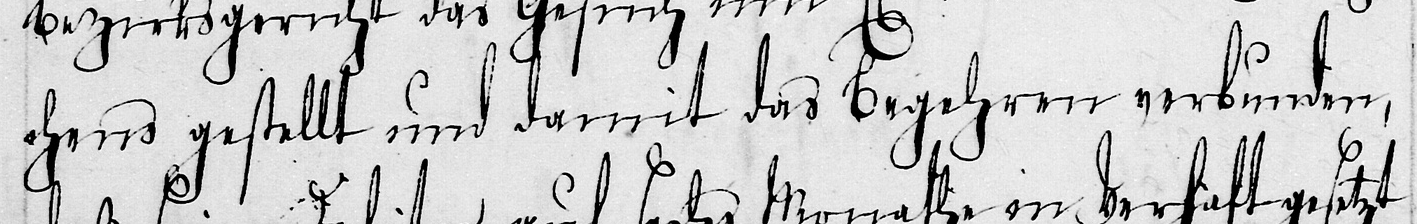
chens gestellt und damit das Begehren verbunden,
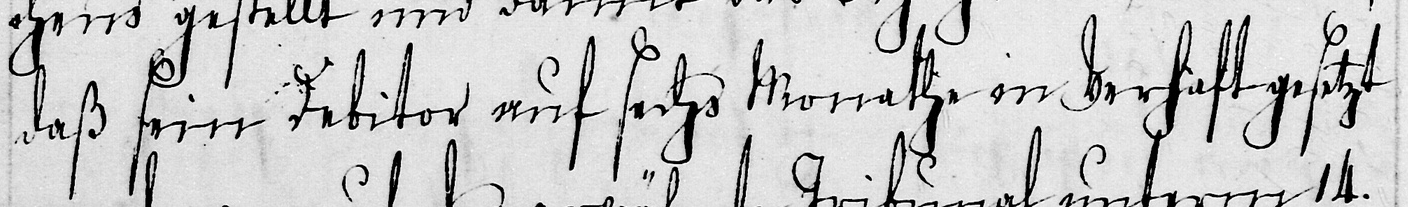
daß sein Debitor auf sechs Monathe in Verhaft gesetzt
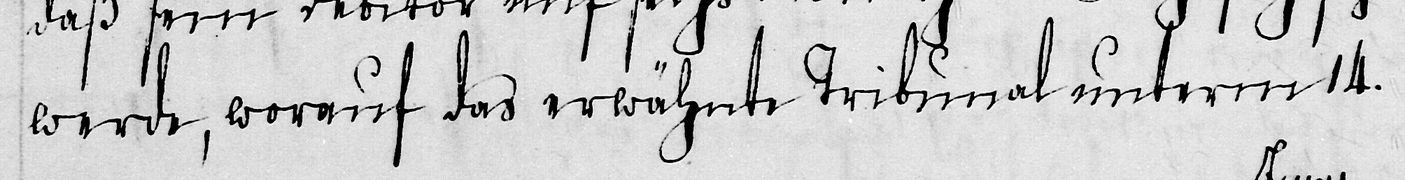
werde, worauf das erwähnte Tribunal unterm 14.
